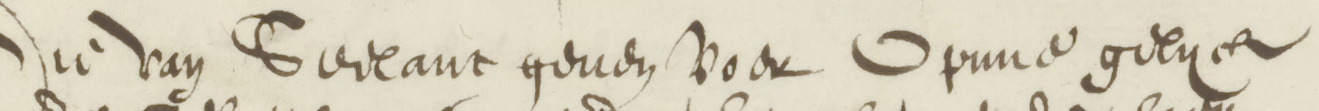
Die van Seelant geuen voer opinie gelyck
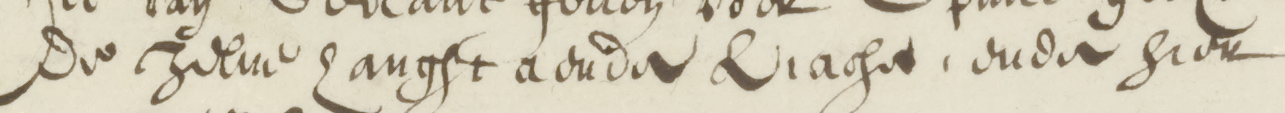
de zelve hanght aenden liashe, ende hier
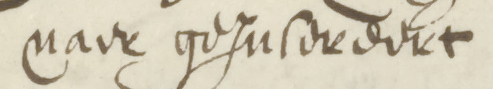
naer geInsereert
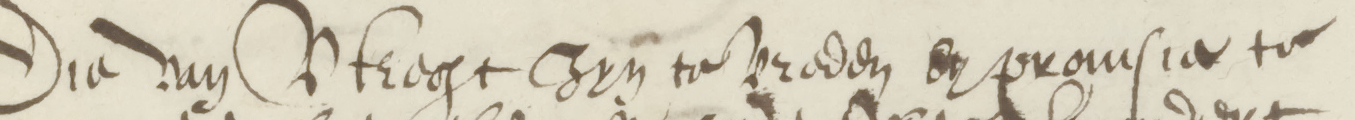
Die van Utrecht zyn te vreden by prouisie te
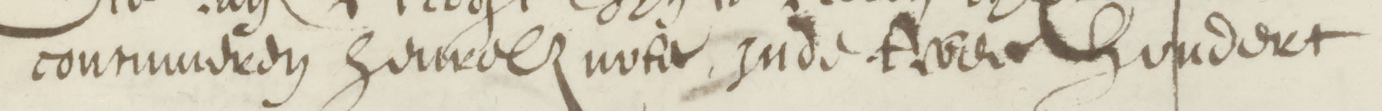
continueren heure Quote Inde twee hundert
